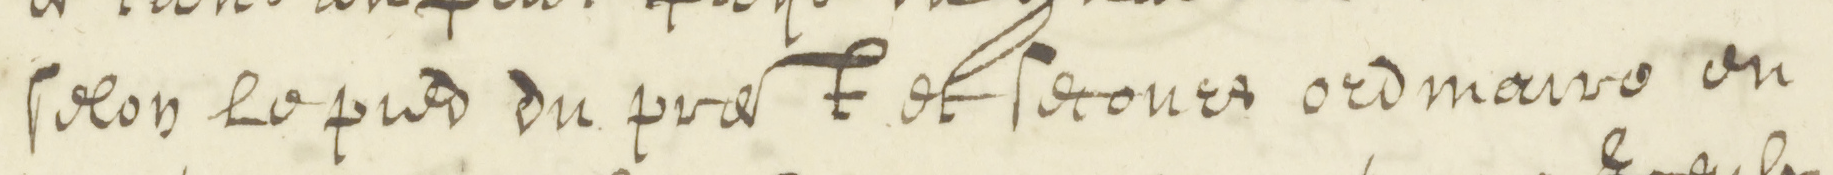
selon le pied du prest et secours ordinaire en
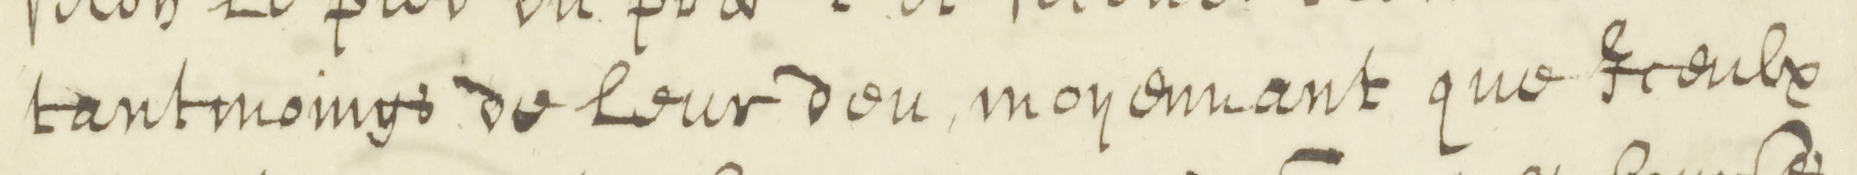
tantmoings de leur deu, moyennant que Iceulx
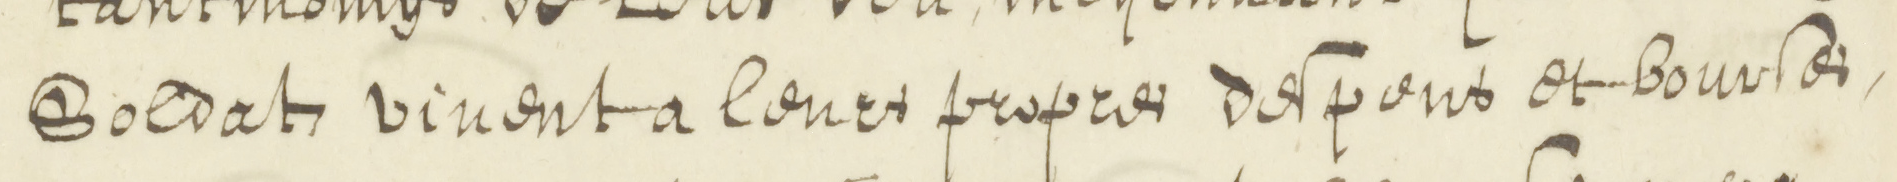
Soldatz viuent a leurs propres despens et bourses,
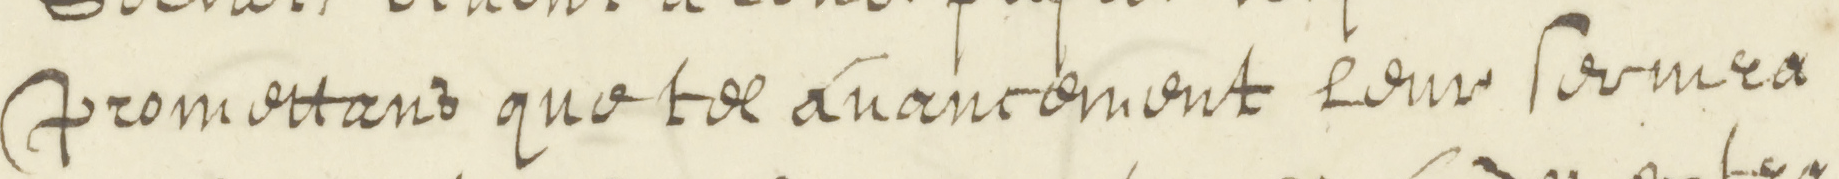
promettans que tel auancement leur seruira
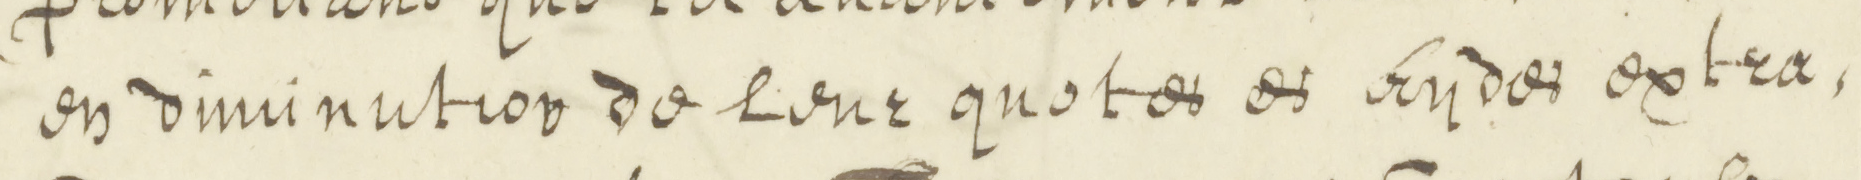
en diminuntion de leur quotes es aydes extra„
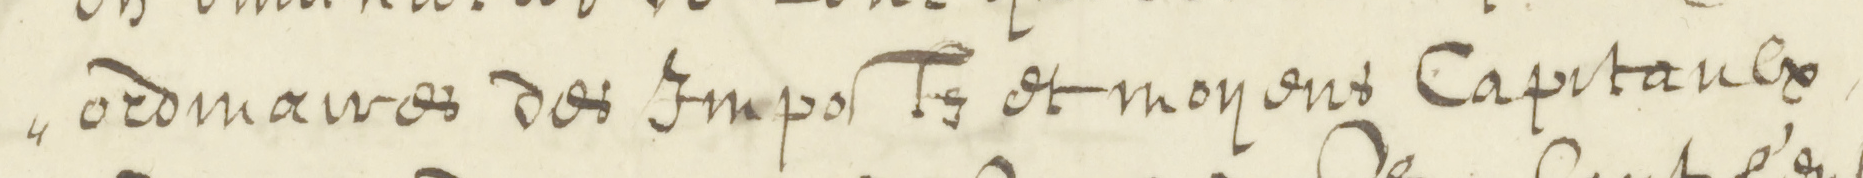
„ordinaires des Impostz et moyens Capitaulx,
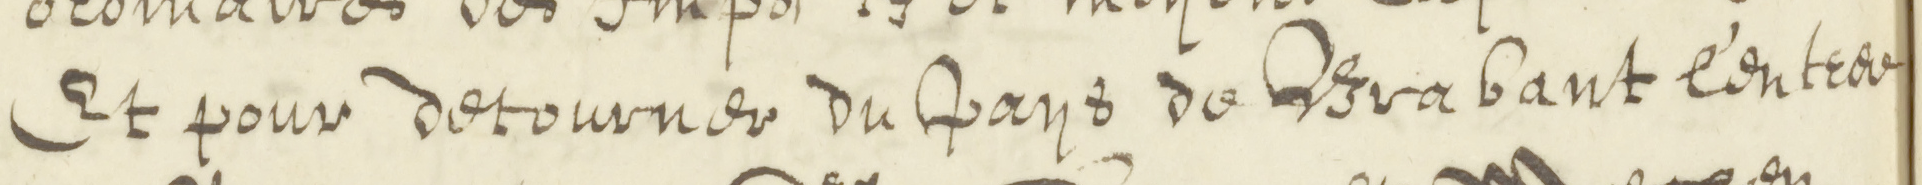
Et pour detourner du Pays de Brabant l‛entree
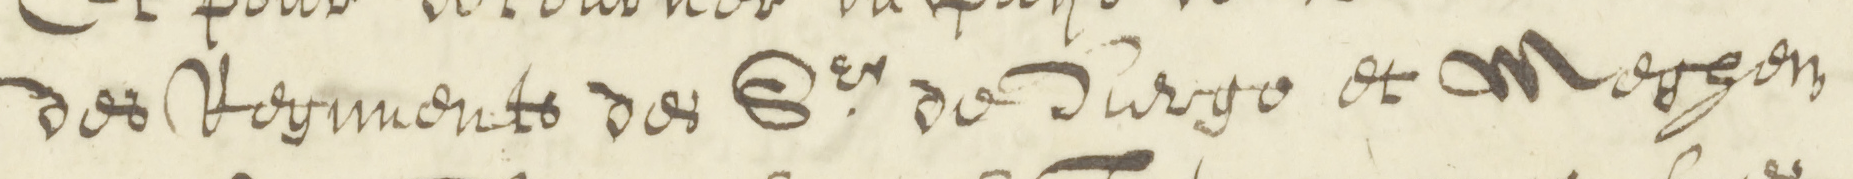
des Regiments des Srs. de Hierge et Meghem
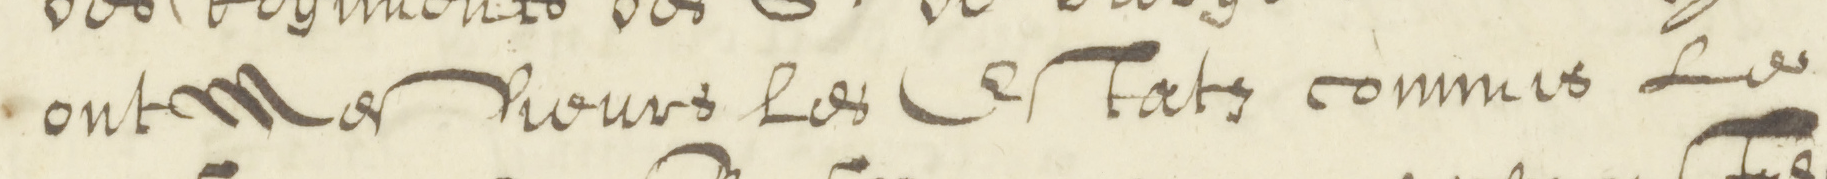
ont Messieurs les Estatz commis le
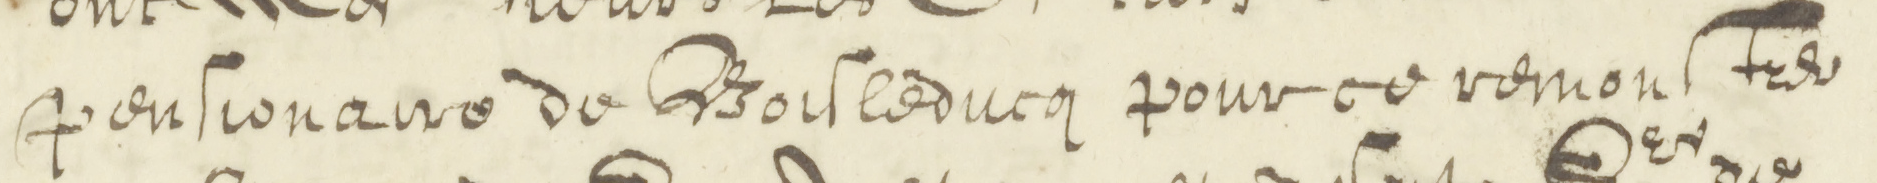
pensionaire de Boisleducq pour ce remonstre
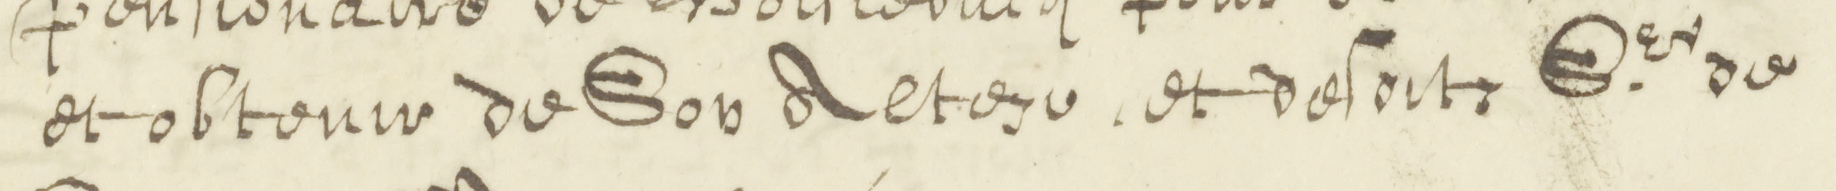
et obtenir de Son Alteze, et desditz, Srs. de
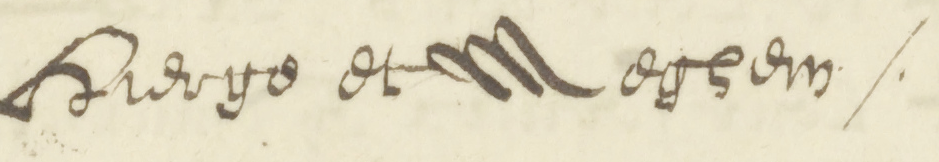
Hierge et Meghem.
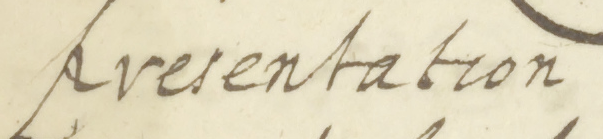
Presentation
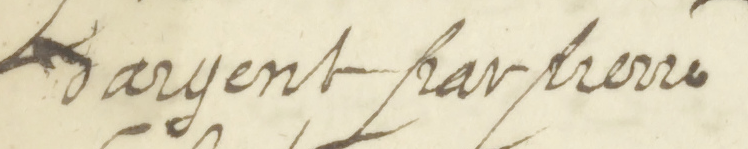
d‛argent par pierre
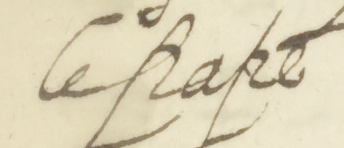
le Pape
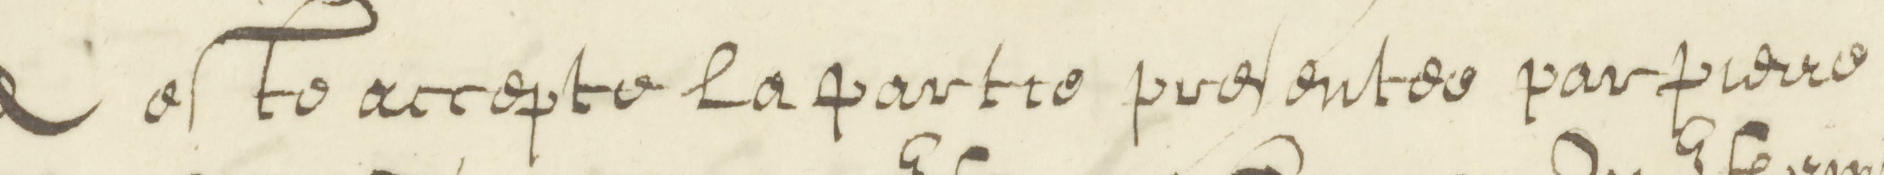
Ceste accepte la partie presentee par pierre
